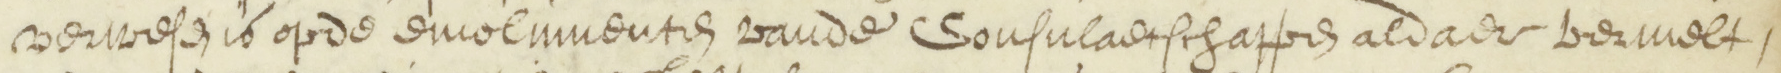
verwesen is opde emolumenten vande Consulaetschappen aldaer vermelt,
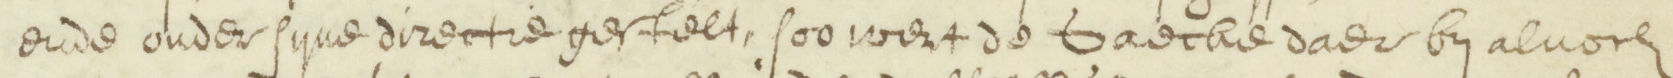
ende onder syne directie gestelt, soo wert de Saecke daer by alnoch
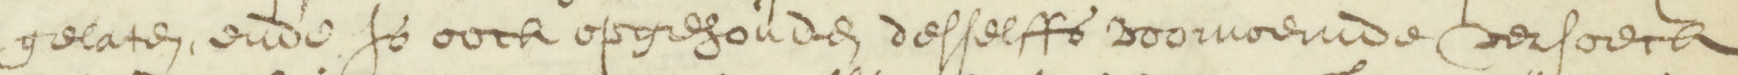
gelaten, ende Is oock opgehouden desselffs voornoemde versoeck
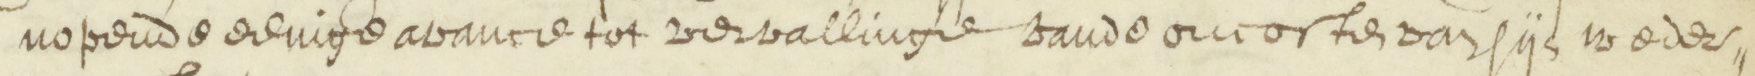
nopende eenige avance tot vervallinge vande oncosten van sijn weder,,
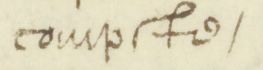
compste.
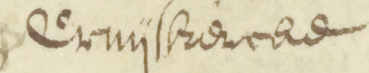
Cruijskercke
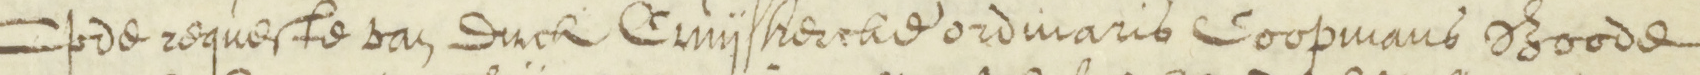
Opde requeste van Dirck Cruijskercke ordinaris Coopmans Boode
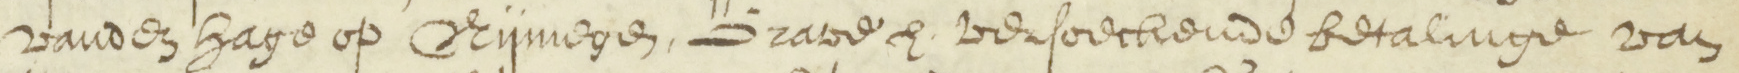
vanden Hage op Nijmegen, Grave @ versoeckende betalinge van
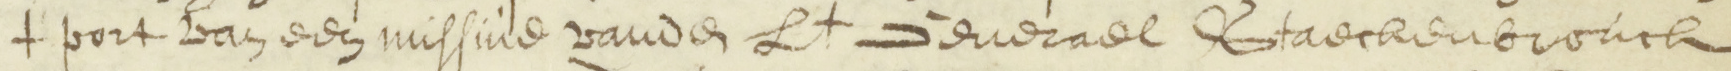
t'port van een missive vanden Lt. Generael Staeckenbrouck
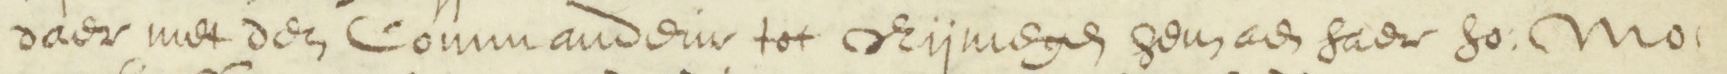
daer met den Commandeur tot Nijmegen hem aen haer ho:Mo:
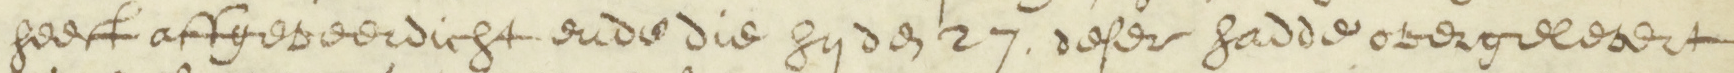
heeft affgeveerdicht ende die hy den 27. deser hadde overgelevert
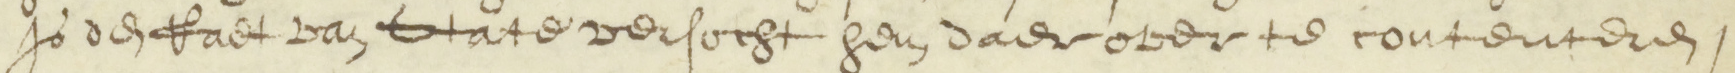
Is den Raet van State versocht hem daer over te contenteren.
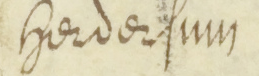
herdersum
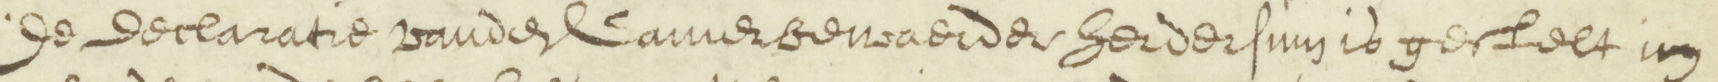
De declaratie vanden Camerbewaerder Herdersum is gestelt in
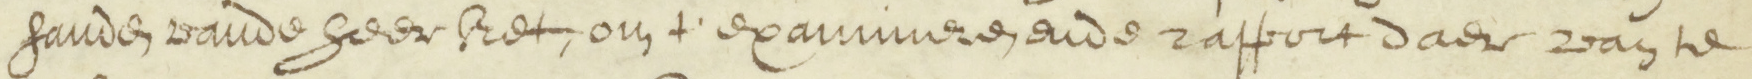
handen vande heer ket, om t‛examineren ende rapport daer van te
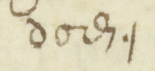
doen.
